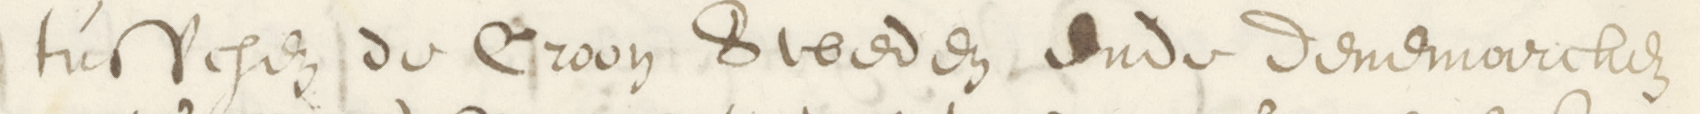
tusschen de Croon Sweden, ende Denemarcken
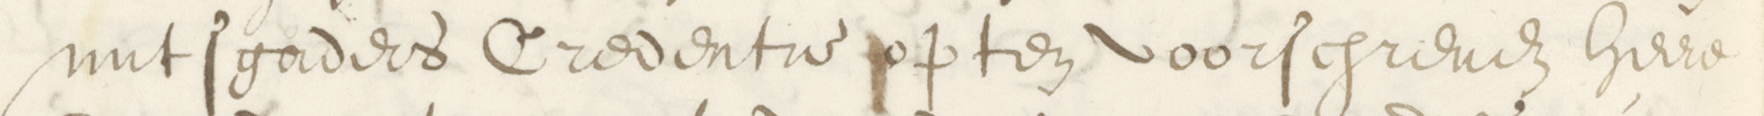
mitsgaders Credentie opten voorschreuen heere
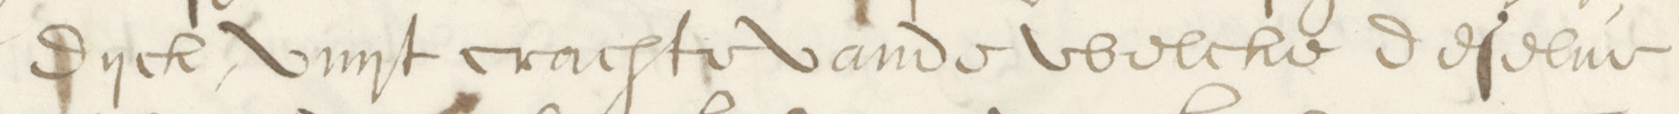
Dyck, vuyt crachte vande welcke deselue
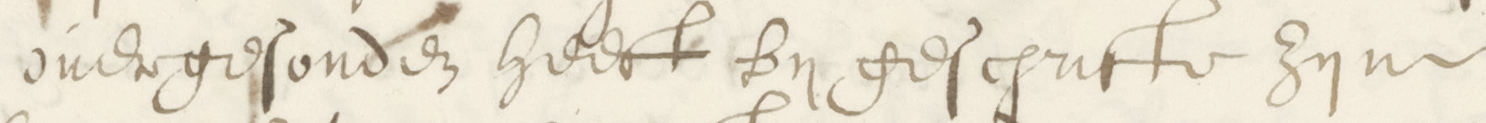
ouergesonden heeft by geschrifte zyne
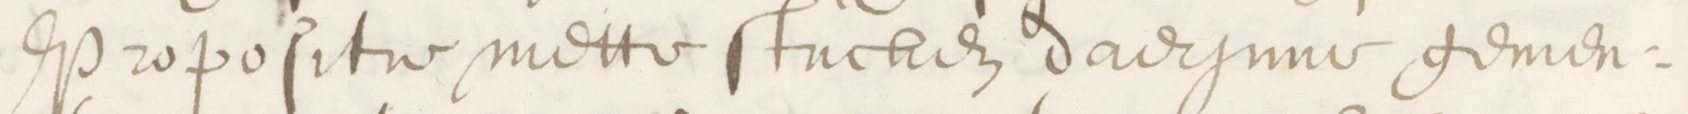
propositie mette stucken daerinne gemen„
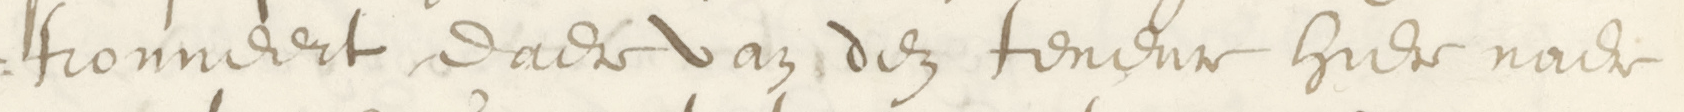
tionneert, daer van den teneur hier naer
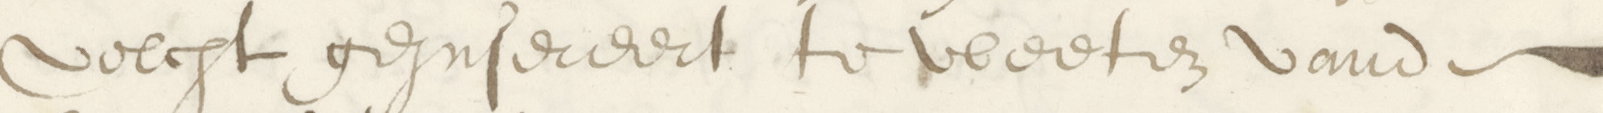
volcht geinsereert te weeten vande
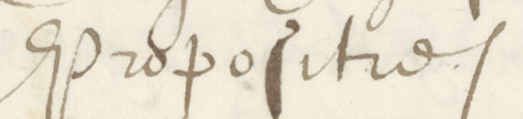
propositie.
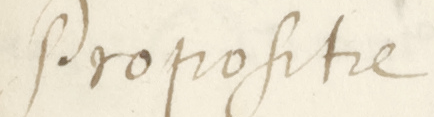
Propositie
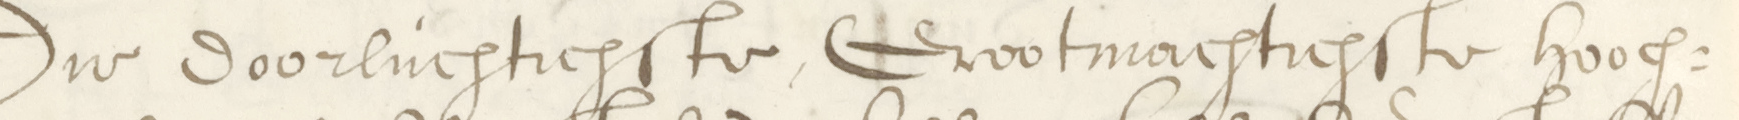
Die Doorluchtichste Grootmachtichste hooch:
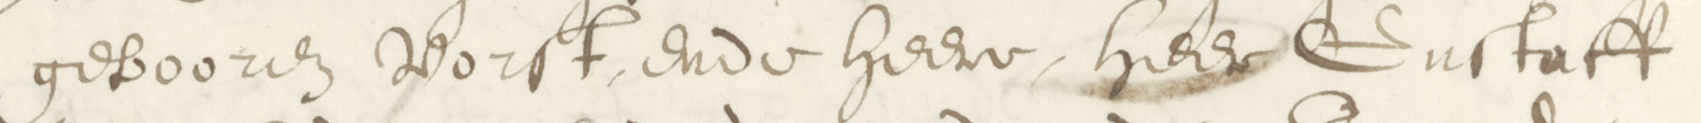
gebooren Vorst, ende heere, heer Gustaff
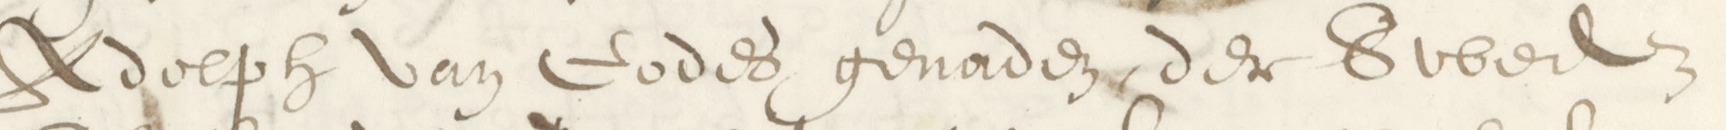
Adolph van Godes genaden, der Sweden
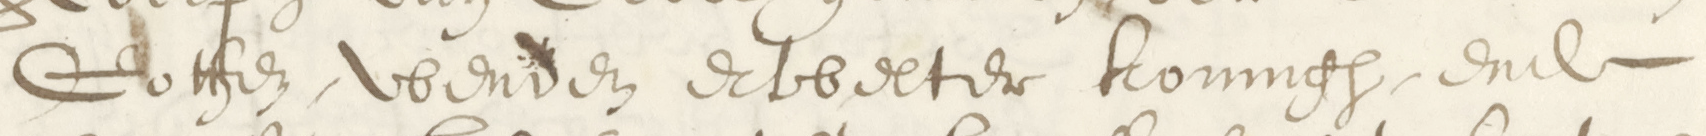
Gothen, wenden erwelter koningh, ende
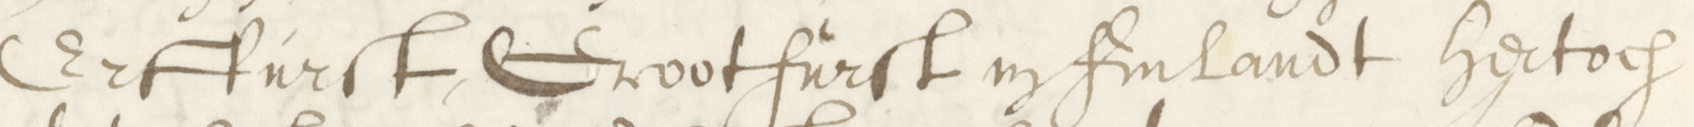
Erffurst, Grootfurst in Finlandt hertoch
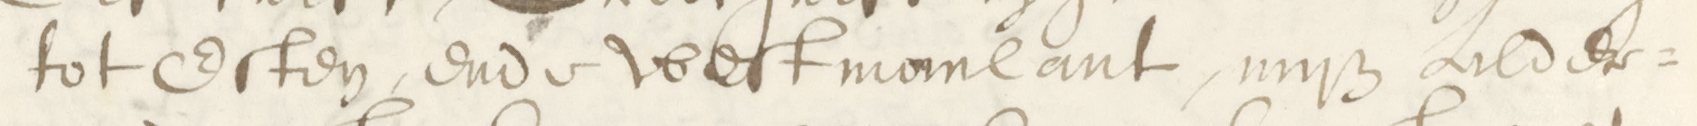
tot Esten ende Westmanlant, myn alder
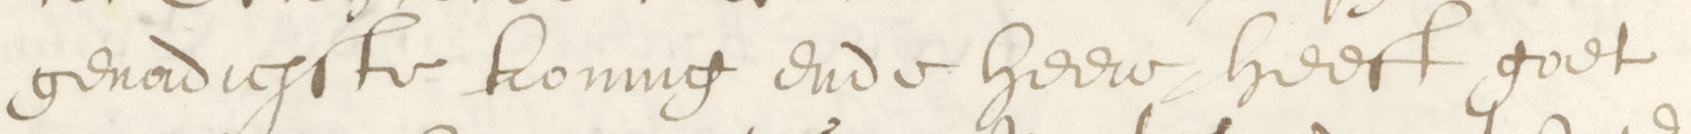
genadichste koning ende heere heeft goet
